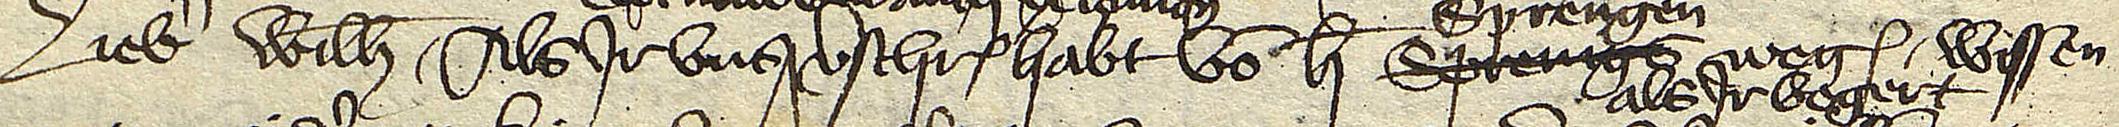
Lieb* Wilh* / Als Ir vns v*ſchr* habt vo* h* Sprenigs weg* / wiſſen
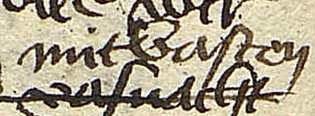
mit vaſten
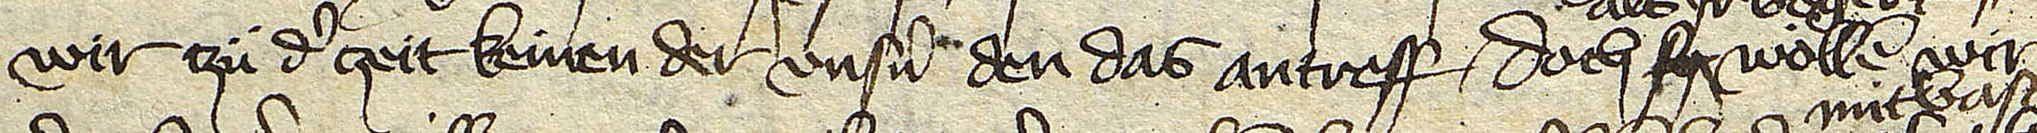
wir cʒü d* cʒeit keinen der vnſn* den das antreff / Doch ſo wölle* wir
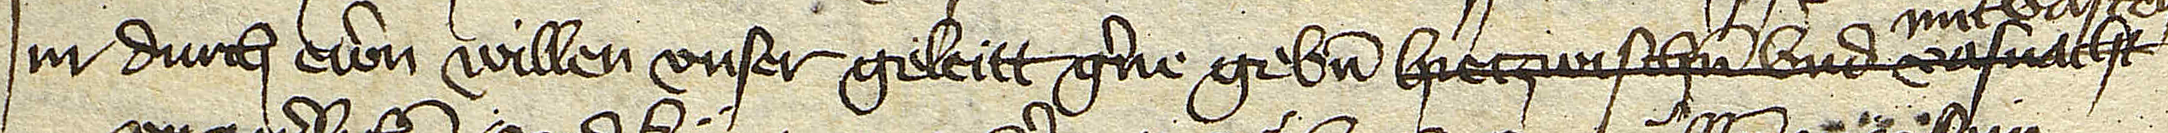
Im durch ewn* willen vnſer geleitt g*ne gebn* hiecʒwiſchn* vnd vaſnacht
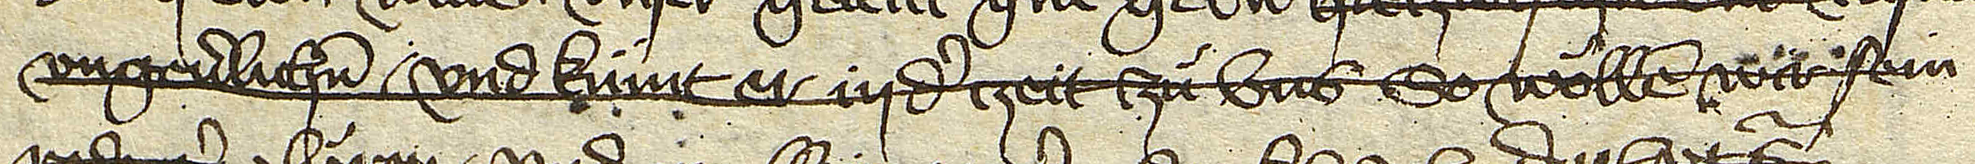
vngeu*lichn* / vnd kümt er in d* cʒeit cʒü vns So wölle* wir ſein
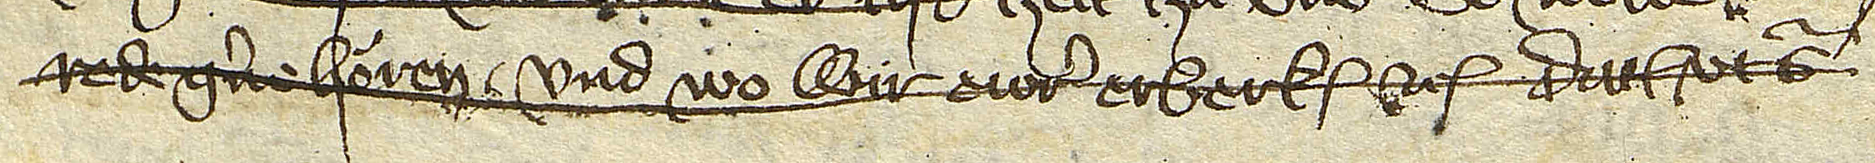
rede g*ne hören / vnd wo wir ewr* erberk* ec* dat* vt s*
